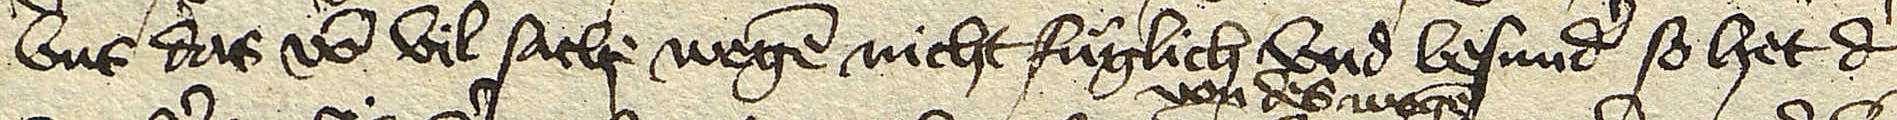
vns das vo* vil ſache wege* nicht füglich / vnd beſund* ſo het d*
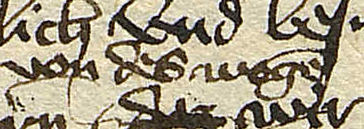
von des wege*
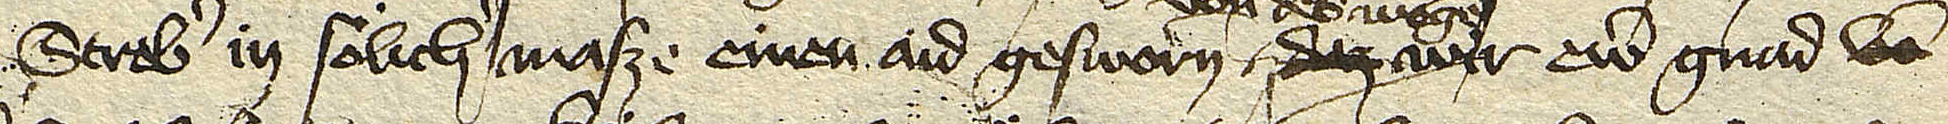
Streb* in ſölich* maſʒe einen aid geſworn / daʒ wir ew*gnad vo*
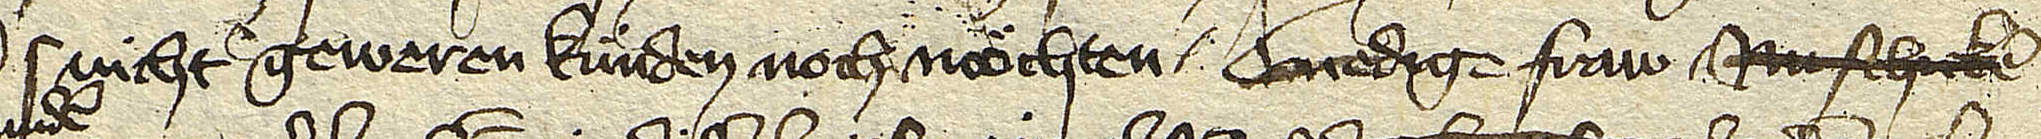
% nicht geweren künden noch möchten / Gnedige fraw / Nu ſchicke*
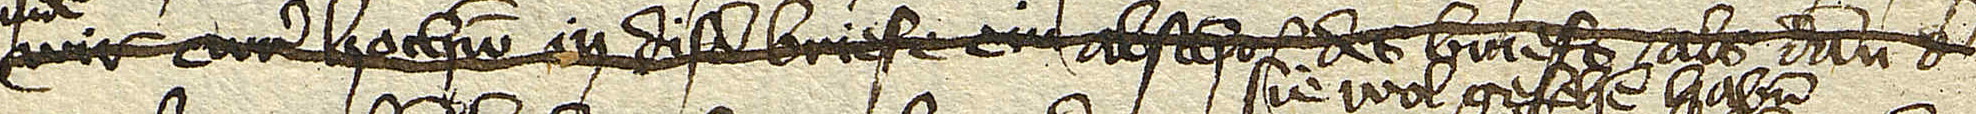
wir ewr* hochw* in diſe* briefe ein abſchr* des briefs / als dan* d*
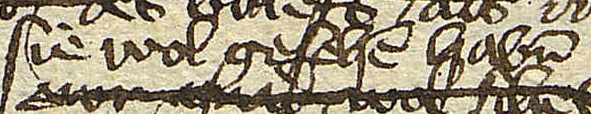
ſie wol geſehe* habn*
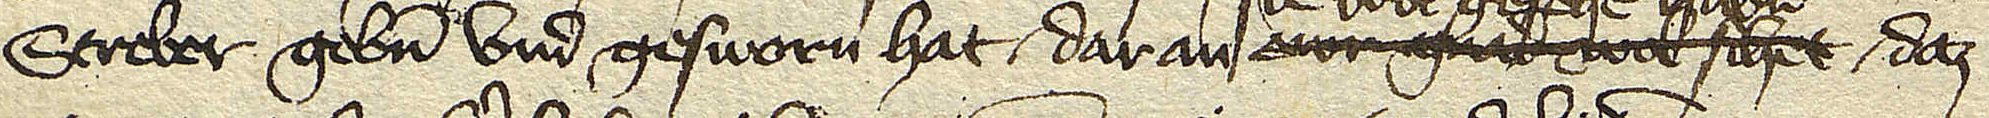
Streber gebn* vnd geſworn hat / daran ewr gnad wol ſehet / daʒ
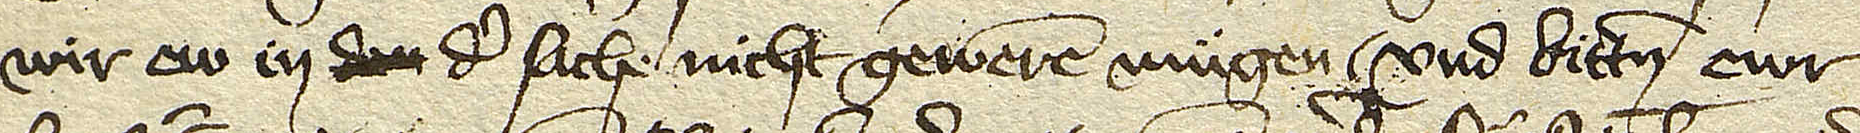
wir ew in den d* ſache nicht gewere* mügen / vnd bittn* ewr
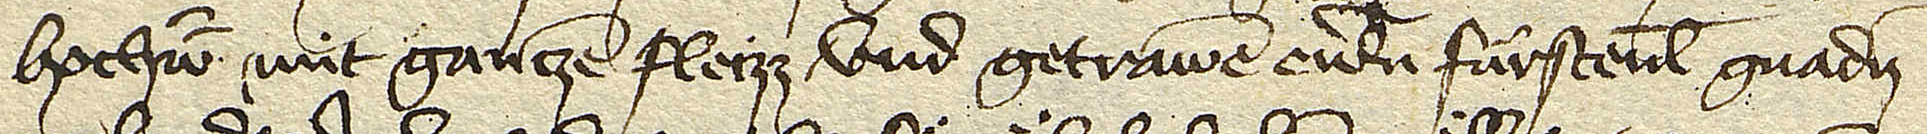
hochw* mit gancʒe fleiʒʒ / vnd getrawe* ew*n fürſtenl* gnadn*
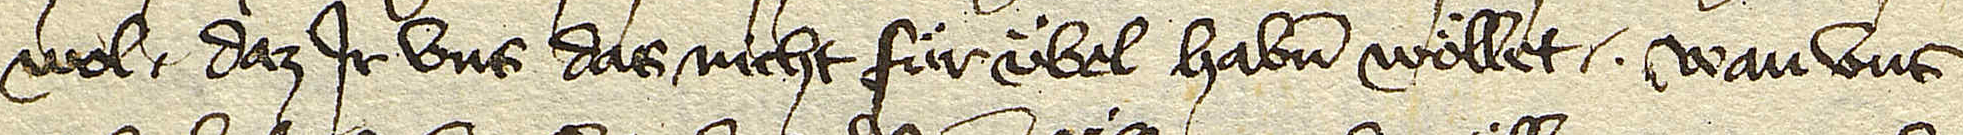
wol / daʒ Ir vns das nicht für v̈bel habn* wöllet /. wan vns
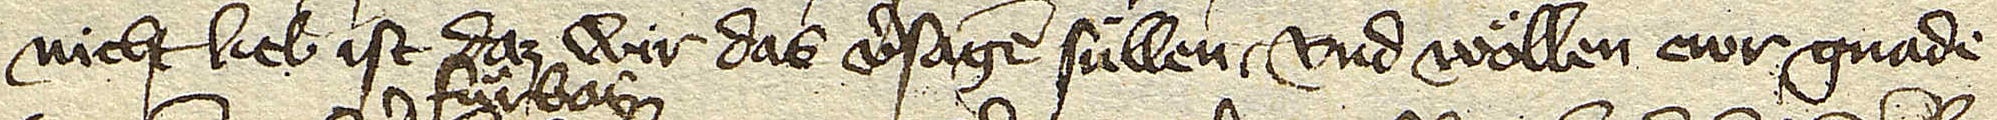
nicht lieb iſt daʒ wir das v*ſage* ſüllen / vnd wöllen ewr gnade
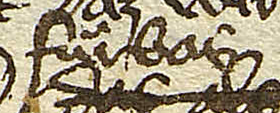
fürbas
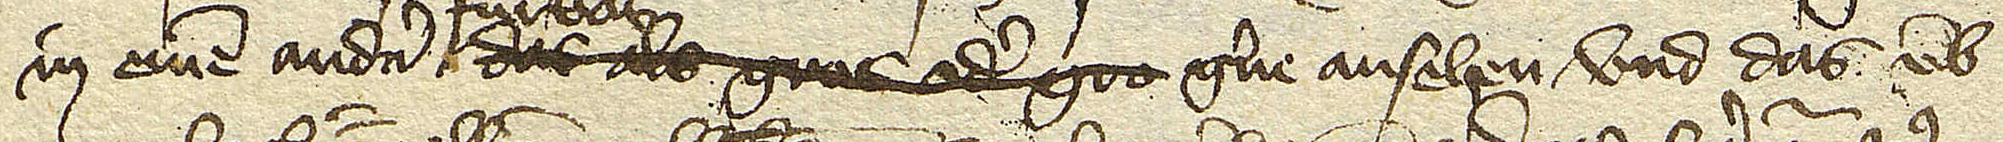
in eine andn* das als gros od* gro g*ne anſehen / vnd das vb*
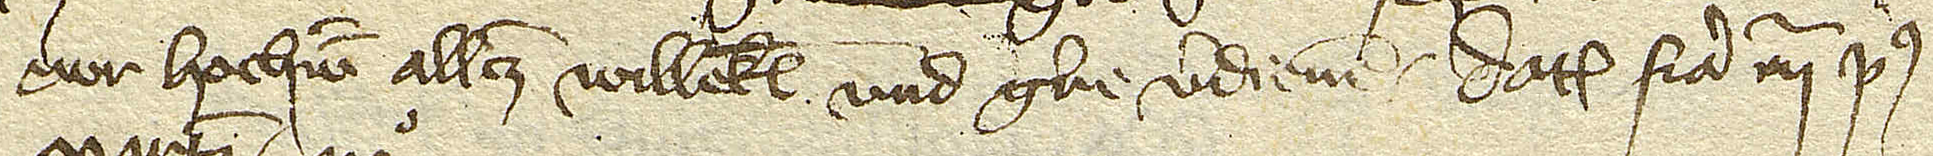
ewr hochw* allcʒ* willekl* vnd g*ne v*diene* / Dat* fia* iiii* p*
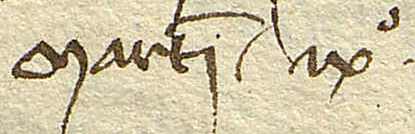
Marti* / ix*.
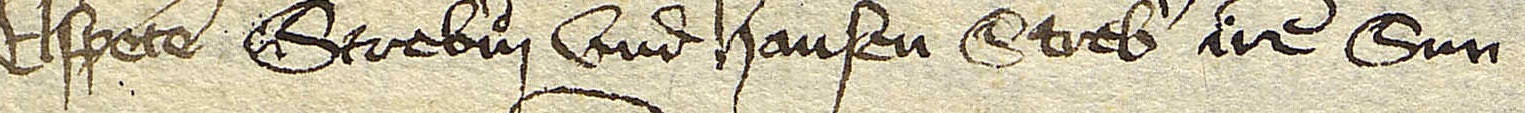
Elſpete* Strebin* vnd hanſen Streb* ire* Sun
